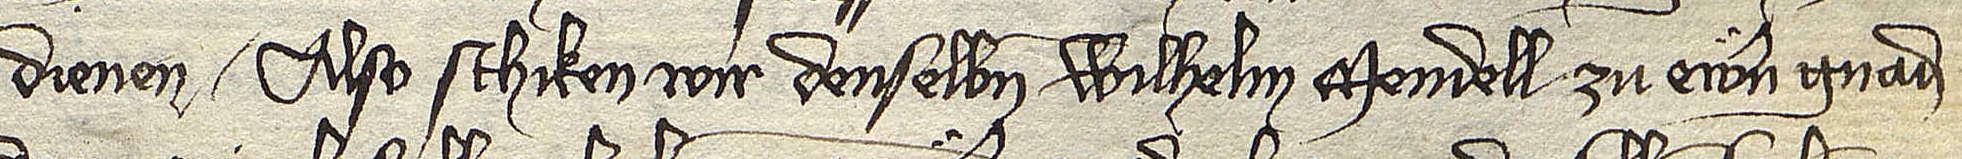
dienen / Alſo ſchiken wir denſelbn* Wilhelm Mendell ʒu eẅ*n gnad*
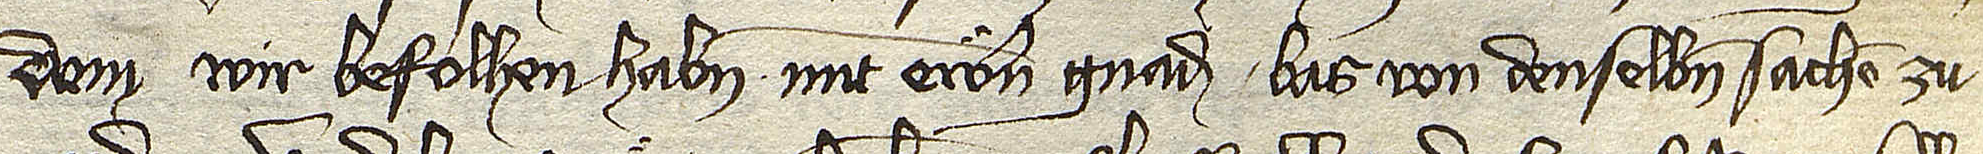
dem wir befolhen habn* mit eẅ*n gnad* / bas von denſelbn* ſache* ʒu
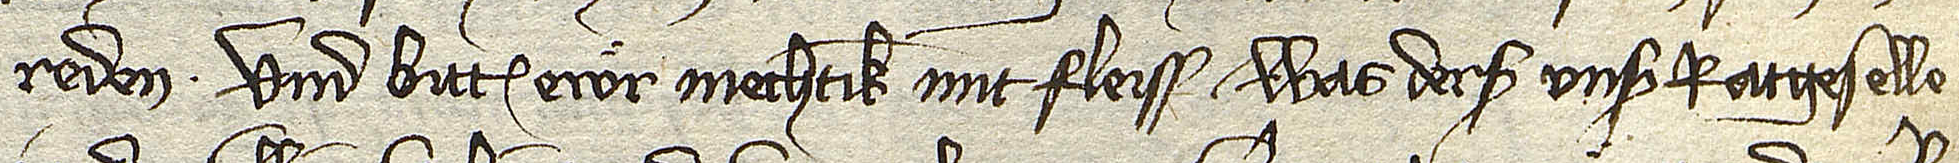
reden . Vnd bitt* eẅr mechtik* mit fleiſſ / Was derſ* vnſ* Ratgeſelle
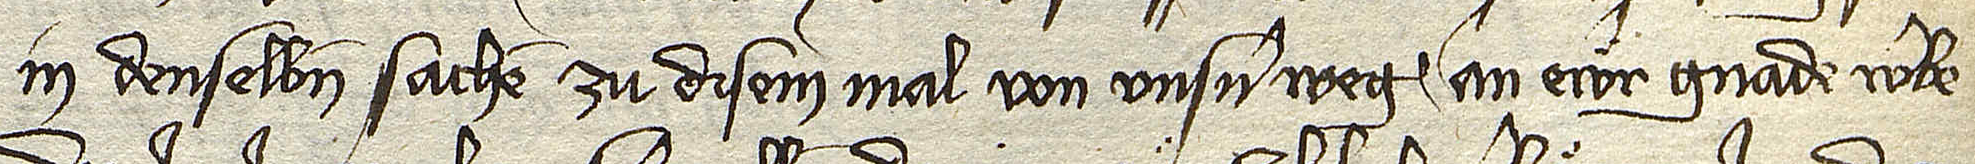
in denſelbn* ſache* ʒu diſem mal von vnſn* weg* an eẅr gnade w*be
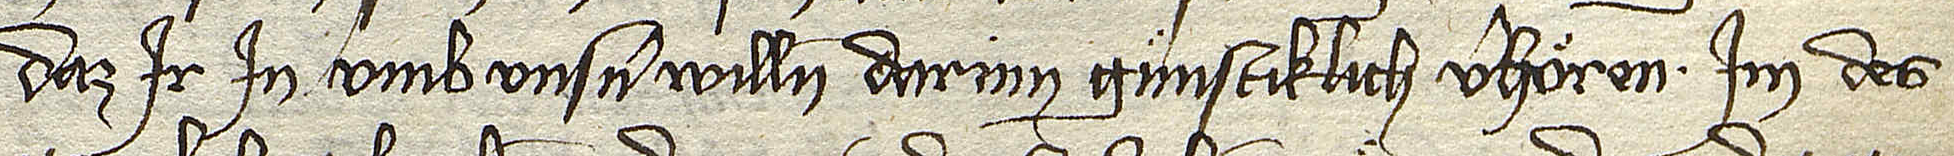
Daʒ Ir In vmb vnſn* willn* darinn günſtiklich v*hören . Im des
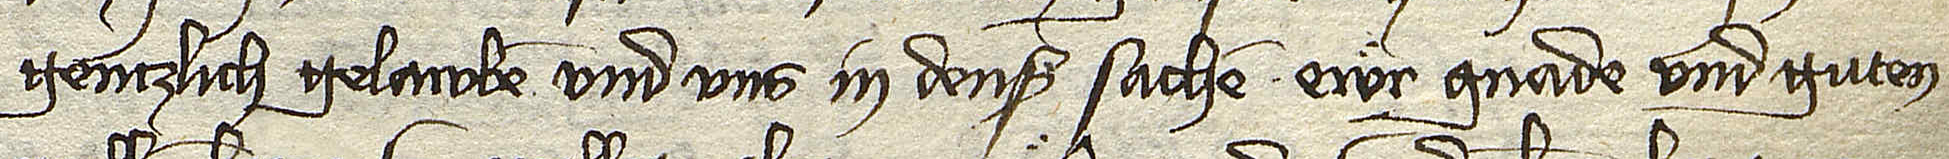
gencʒlich gelawbe* vnd vns in denſ* ſache* . eẅr gnade vnd guten
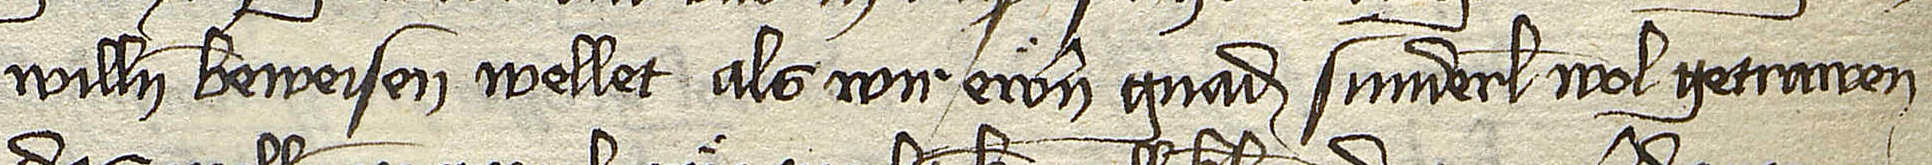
willn* beweiſen wellet als wir eẅ*n gnad* ſunderl* wol getrawen
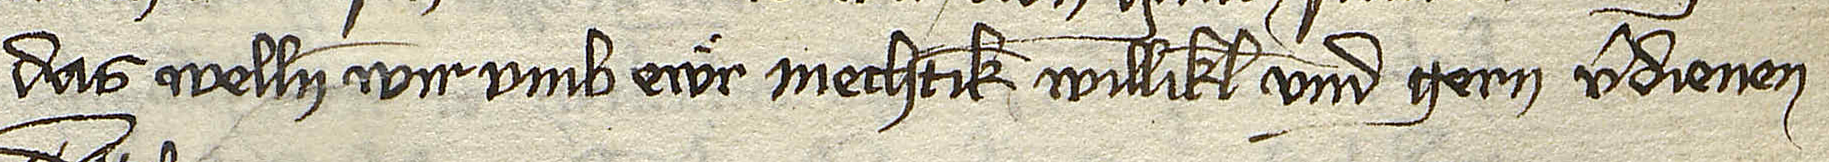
das welln* wir vmb eẅr mechtik* willikl* vnd gern v*dienen
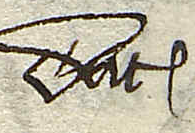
Dat*
